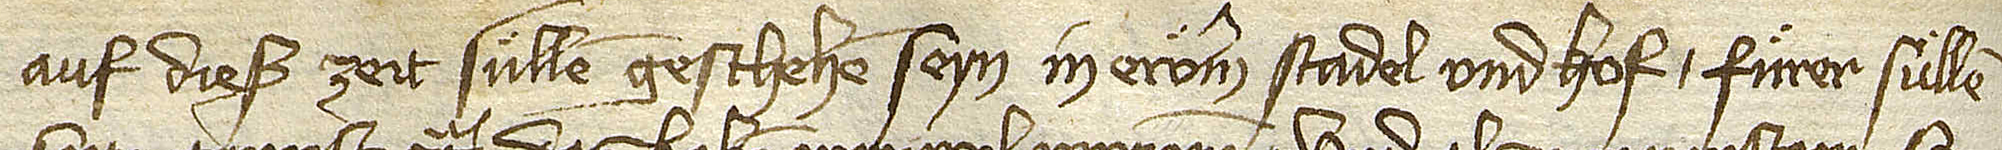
auf dieſ* ʒeit ſülle* geſchehe* ſeyn in ew*m ſtadel vnd hof / fürer ſülle*
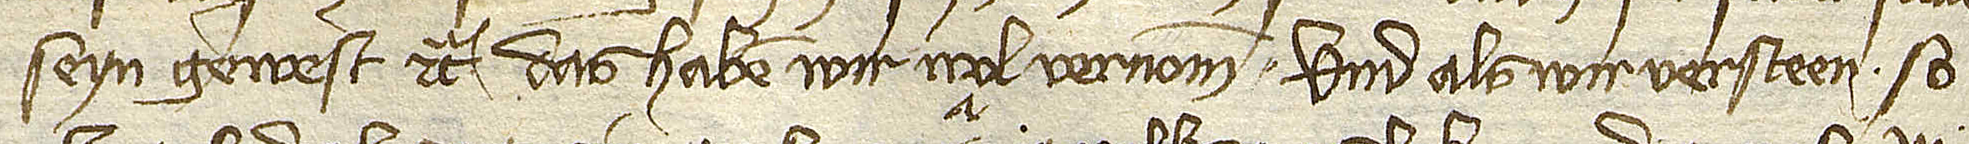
ſeyn geweſt ec* das habe* wir wol vernom* / Vnd als wir verſteen . ſo
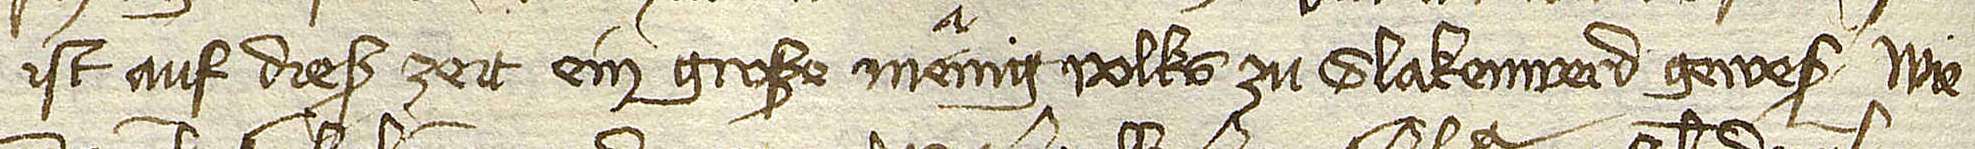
iſt auf dieſ* ʒeit ein groſʒe mënig volks ʒu Slakenwerd geweſ* wie
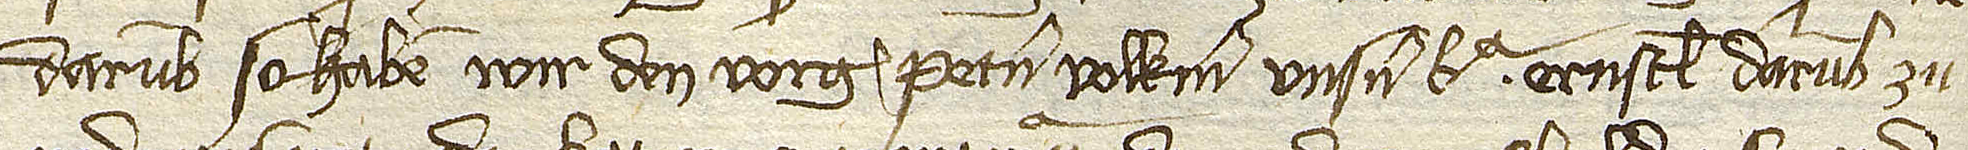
darub* ſo habe* wir den vorg* Pet*n volkm* vnſ*n b* . ernſtl* darub* ʒu
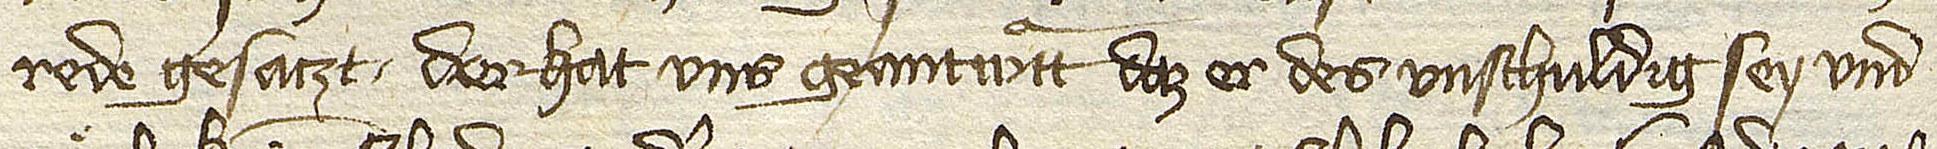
rede geſacʒt / der hat vns geantw*tt daʒ er des vnſchuldig ſey vnd
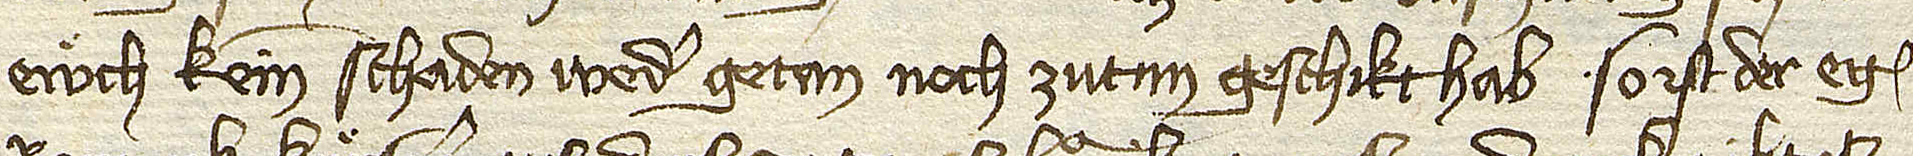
ewch kein* ſchaden wed* getan noch ʒutun geſchikt hab . ſo iſt der eg*
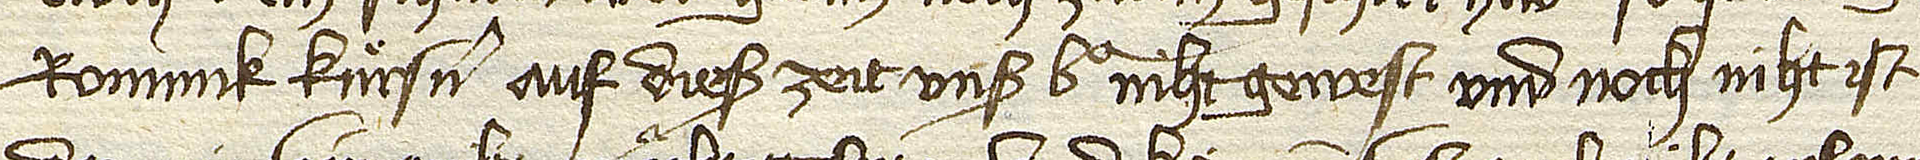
Rommik kürſn* auf dieſ* ʒeit vnſ* b* niht geweſt vnd noch niht iſt
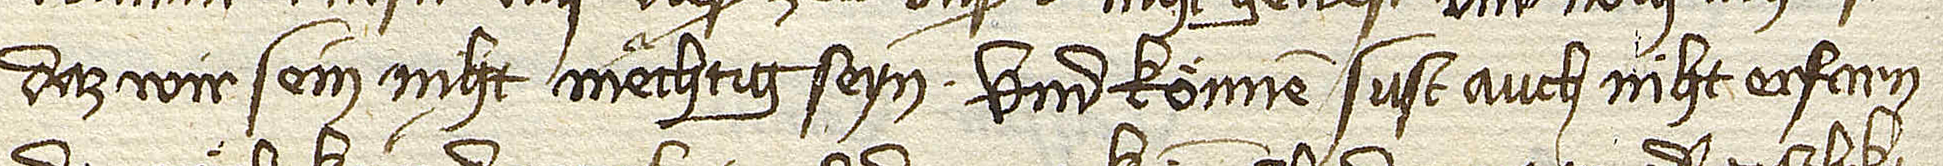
daʒ wir ſein niht mëchtig ſeyn . Vnd könne* ſuſt auch niht erfarn
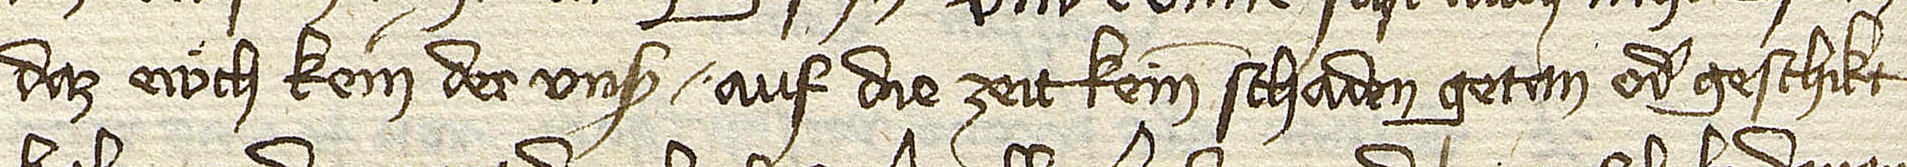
daʒ ewch kein der vnſ* / . auf die ʒeit kein* ſchaden getan od* geſchikt
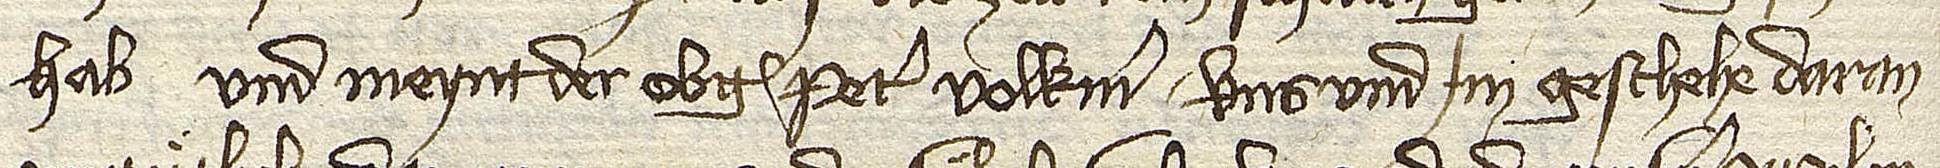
hab vnd meynt der obg* Pet* volkm* / Vns vnd Im geſchehe daran
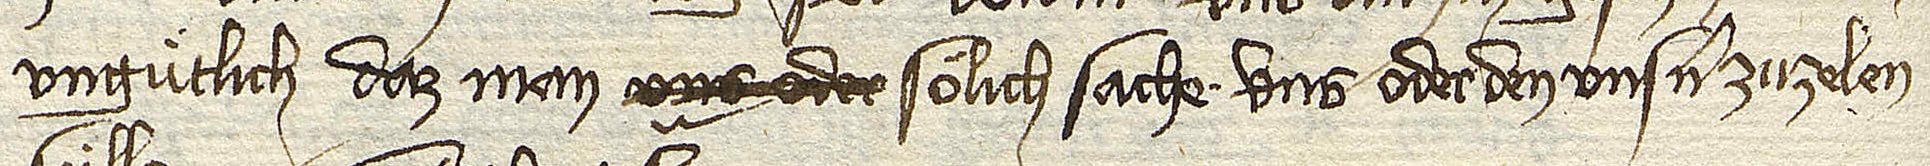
vngütlich daʒ man vns oder ſölich ſache . Vns oder den vnſ*n ʒuʒelen
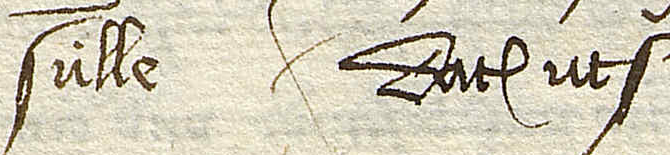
ſülle / Dat* ut ſ*
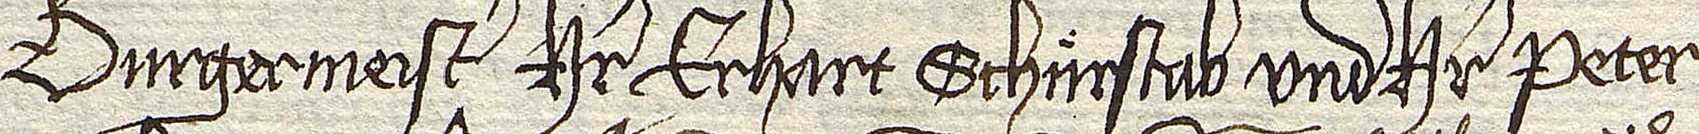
Burgermeiſt* H*r Erhart Schürſtab vnd H*r Peter
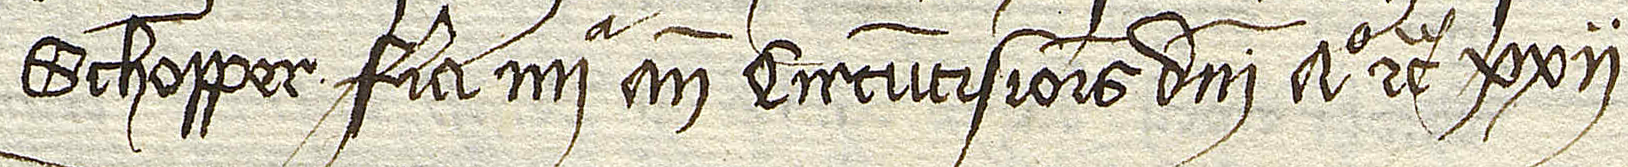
Schopper . fia* iiii* an* Circu*ciſio*is dni* A* ec* xxii*
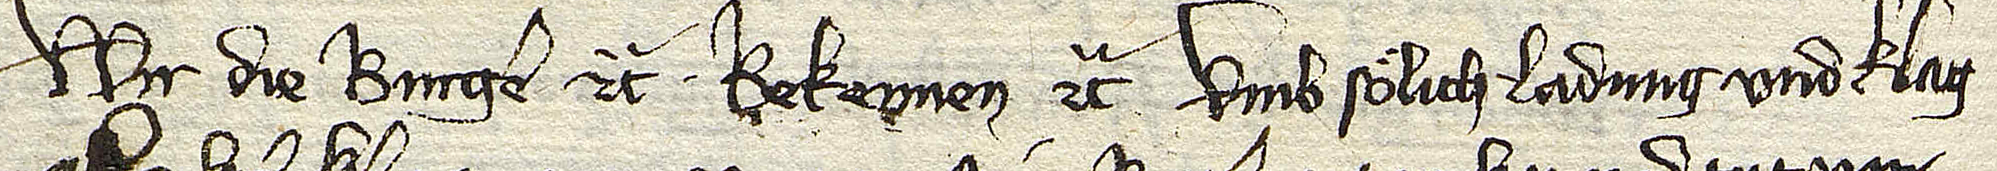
Wir die Burge* ec* . Bekennen ec* Vmb ſölich ladung vnd klag
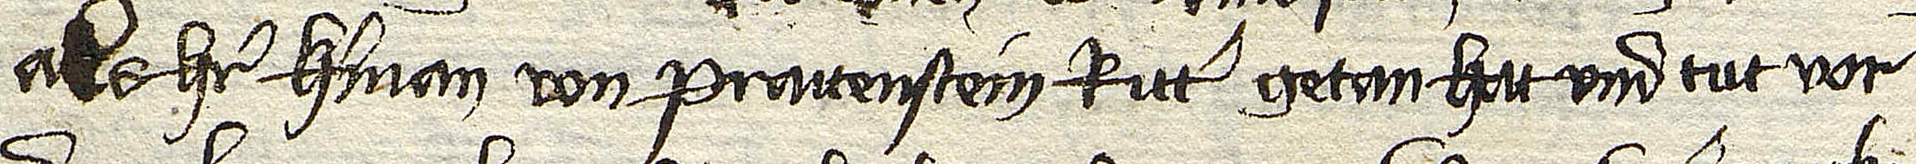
als h*r H*man von Prantenſtein Ritt* getan hat vnd tut vor
